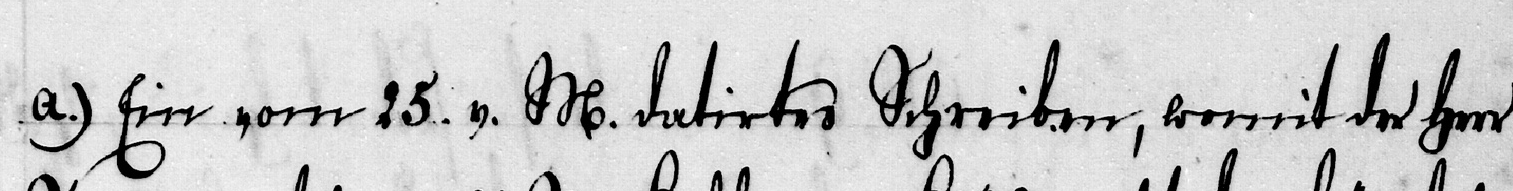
a.) Ein vom 25. v. M. datirtes Schreiben, womit der Herr
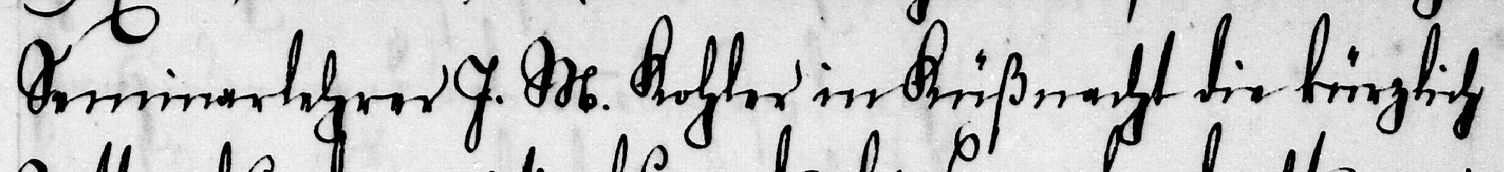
Seminarlehrer J. M. Kohler in Küßnacht die kürzlich
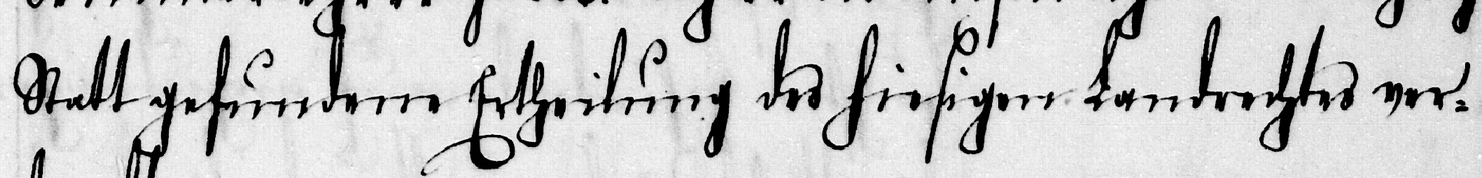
Statt gefundene Ertheilung des hiesigen Landrechtes ver¬
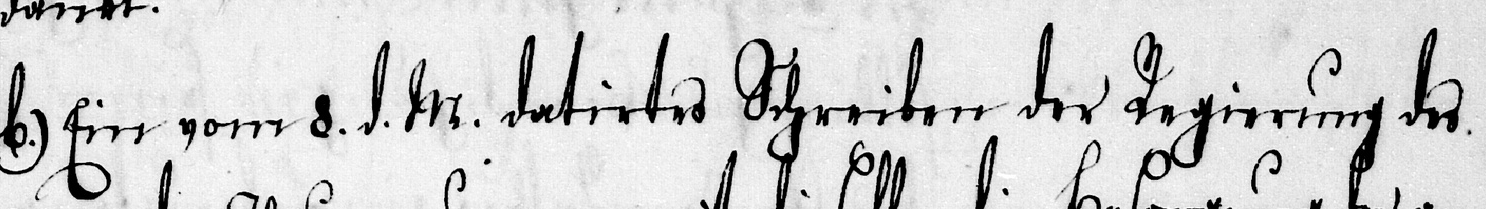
b.) Ein vom 8. d. M. datirtes Schreiben der Regierung des
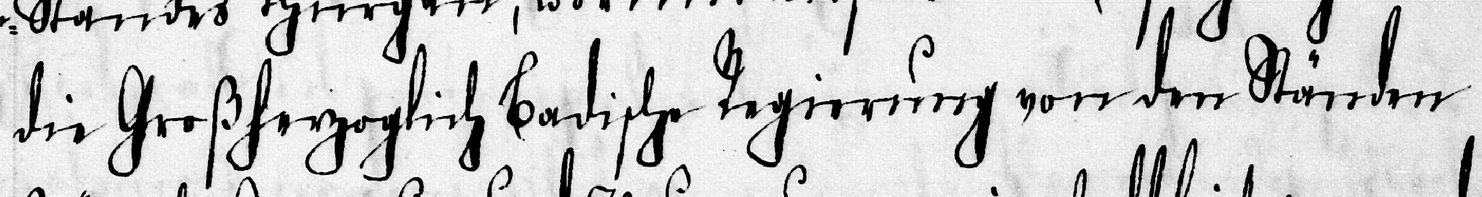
die Großherzoglich Badische Regierung von den Ständen
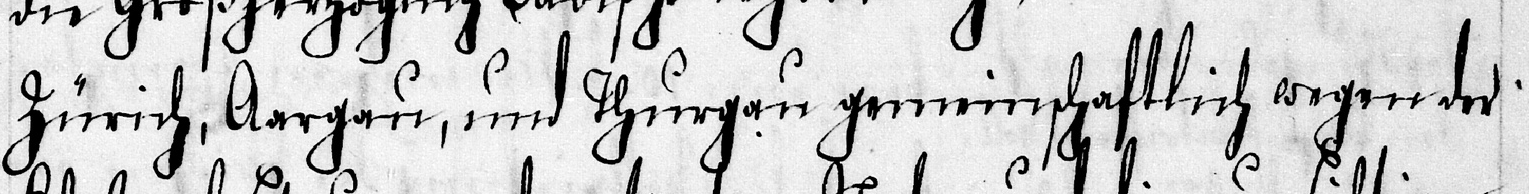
Zürich, Aargau, und Thurgau gemeinschaftlich wegen der
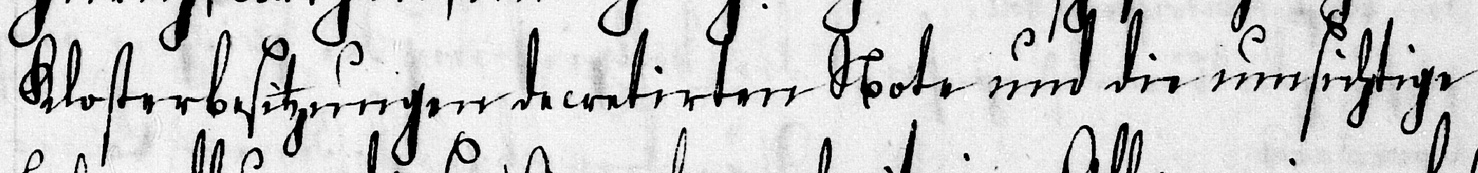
Klosterbesitzungen decretirten Note und die umsichtige
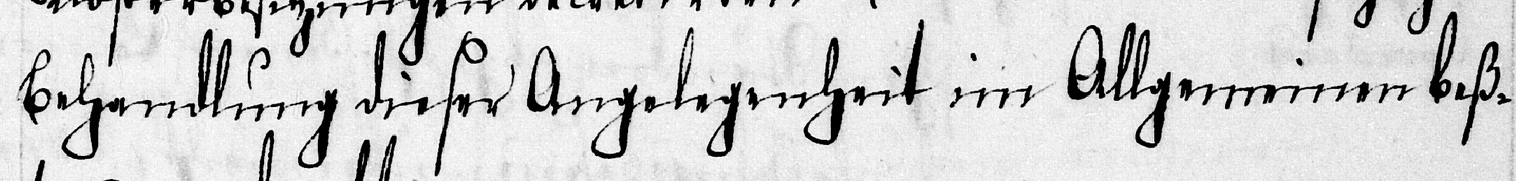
Behandlung dieser Angelegenheit im Allgemeinen beß¬
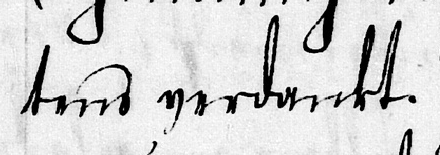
tens verdankt.
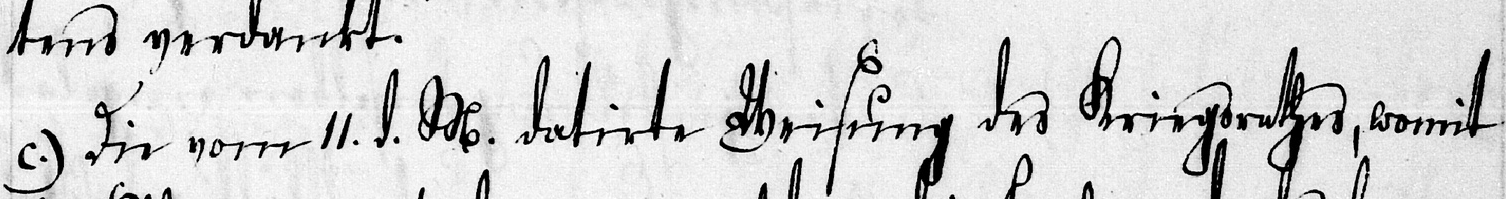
c.) Die vom 11. d. M. datirte Weisung des Kriegsrathes, womit
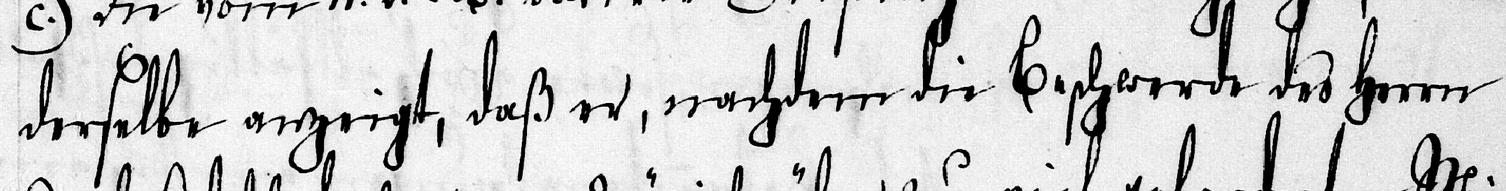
derselbe anzeigt, daß er, nachdem die Beschwerde des Herrn
